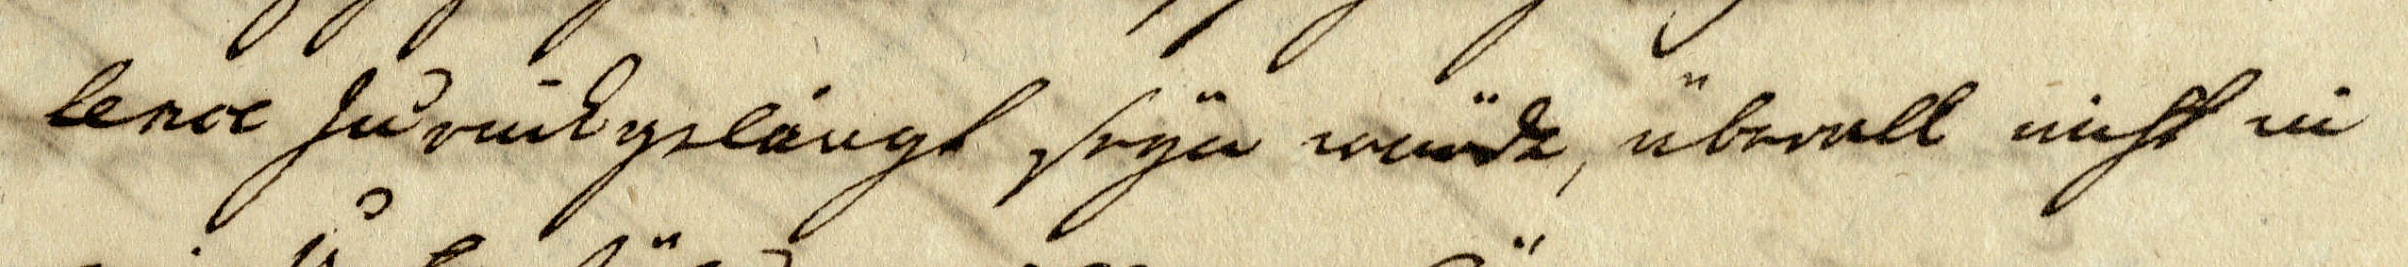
lence zurückgelanget seÿn würde, überall nicht in
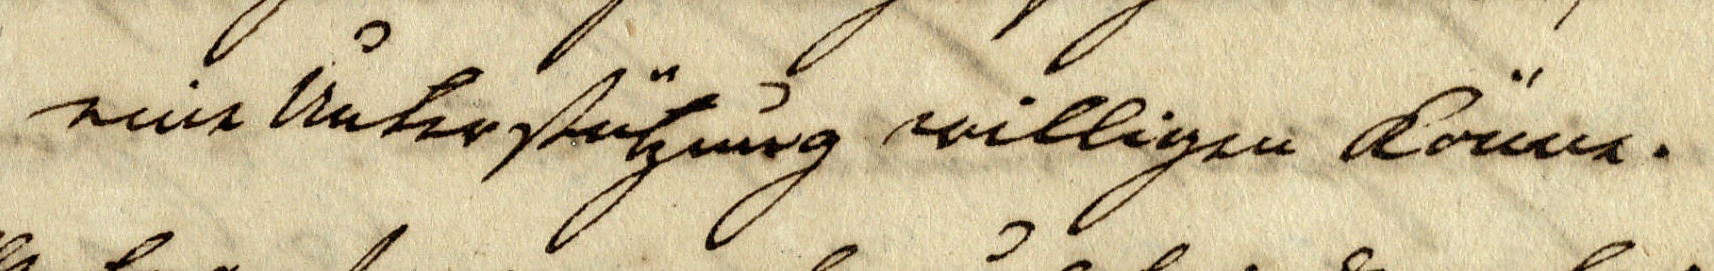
eine Unterstützung willigen könne.
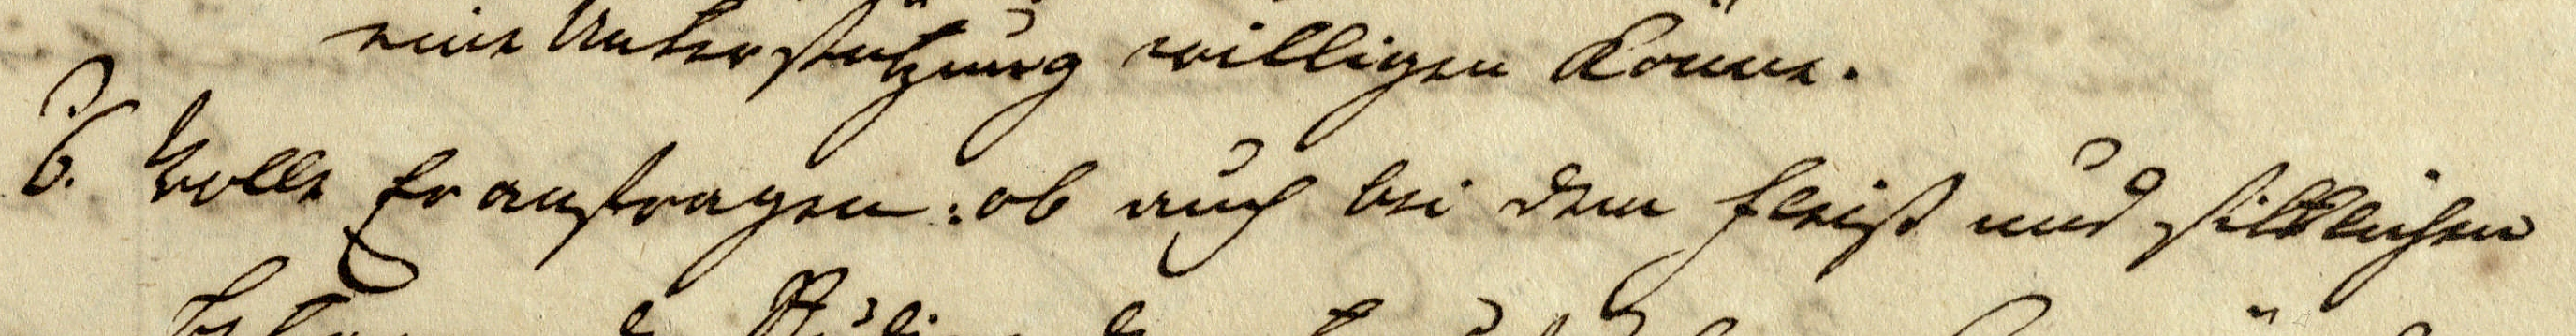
6. Wolle Er anfragen: ob auch bei dem Fleiß und sittlichen
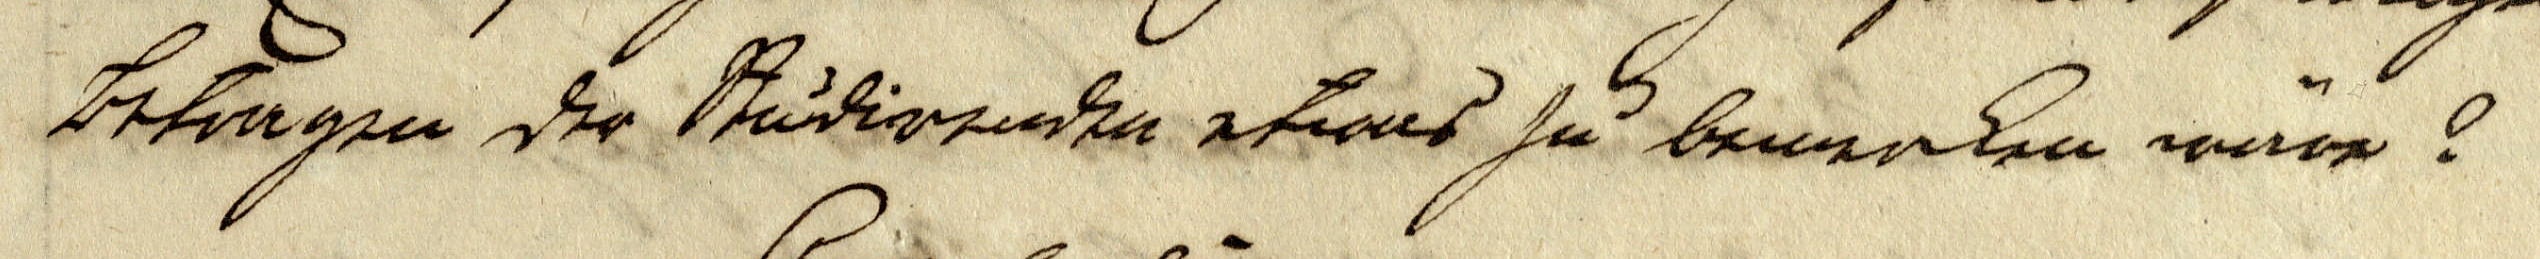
Betragen der Studirenden etwas zu bemerken wäre?
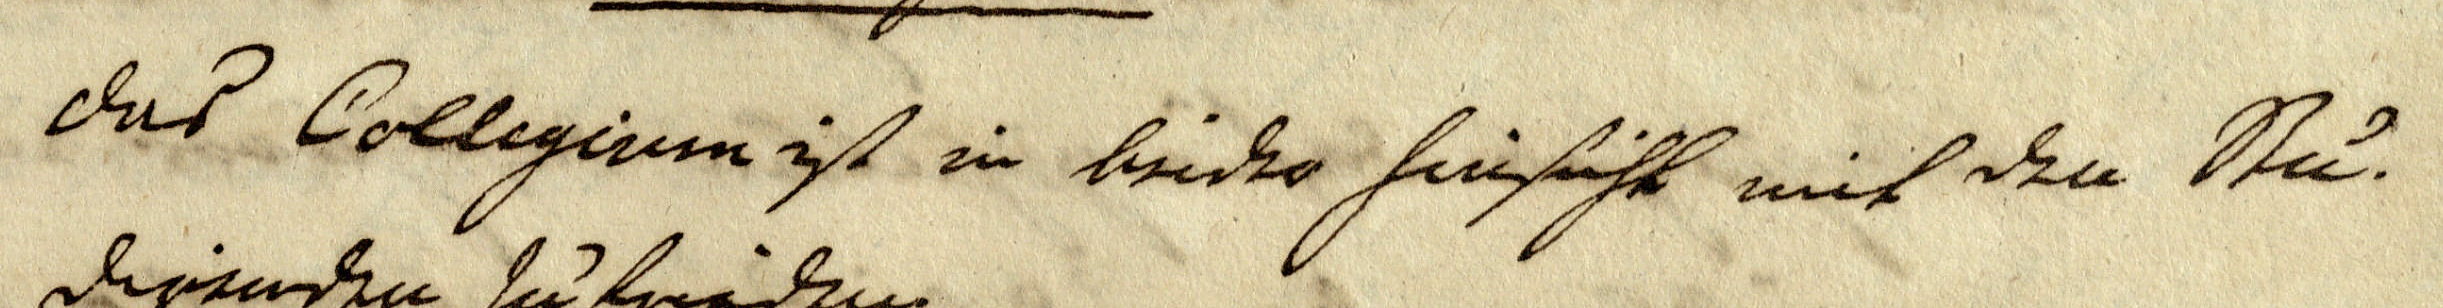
Das Collegium ist in beider Hinsicht mit den Stu¬
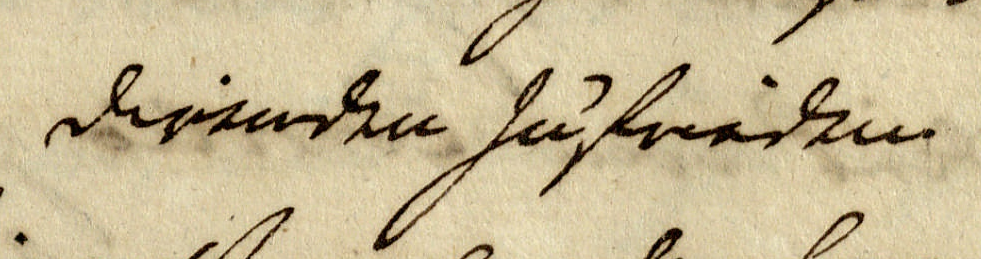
direnden zufrieden.
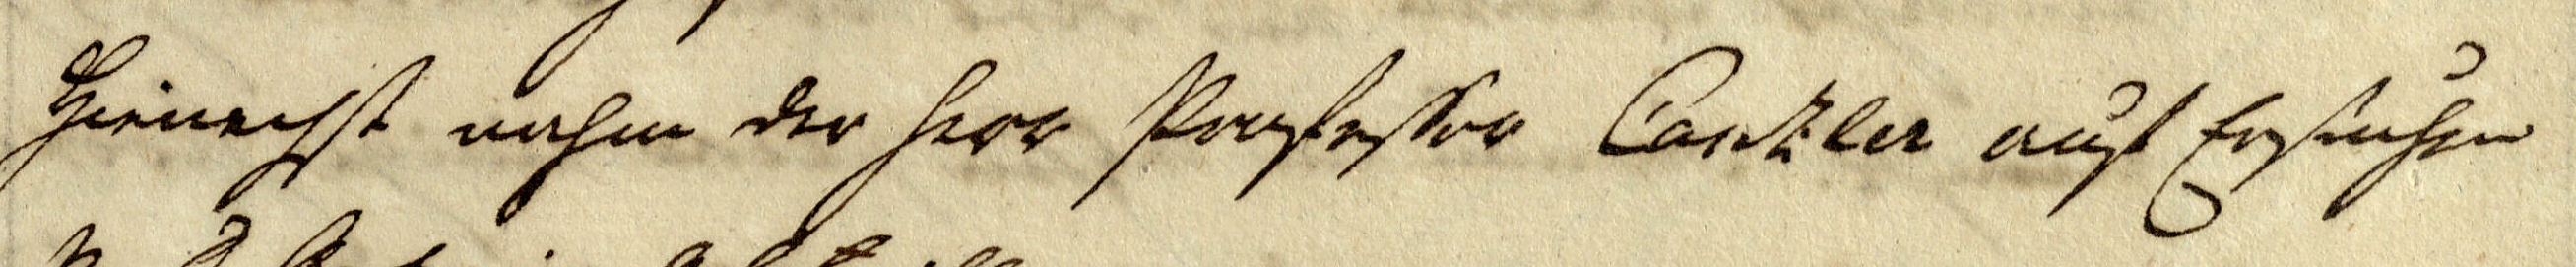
Hienechst nahm der Herr Professor Canzler auf Ersuchen
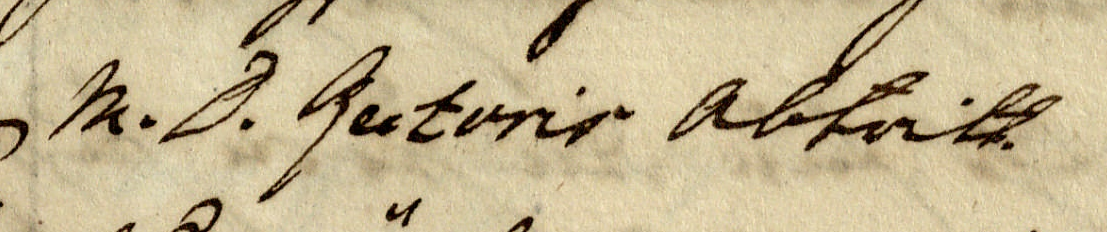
M. D. Rectoris Abtritt.
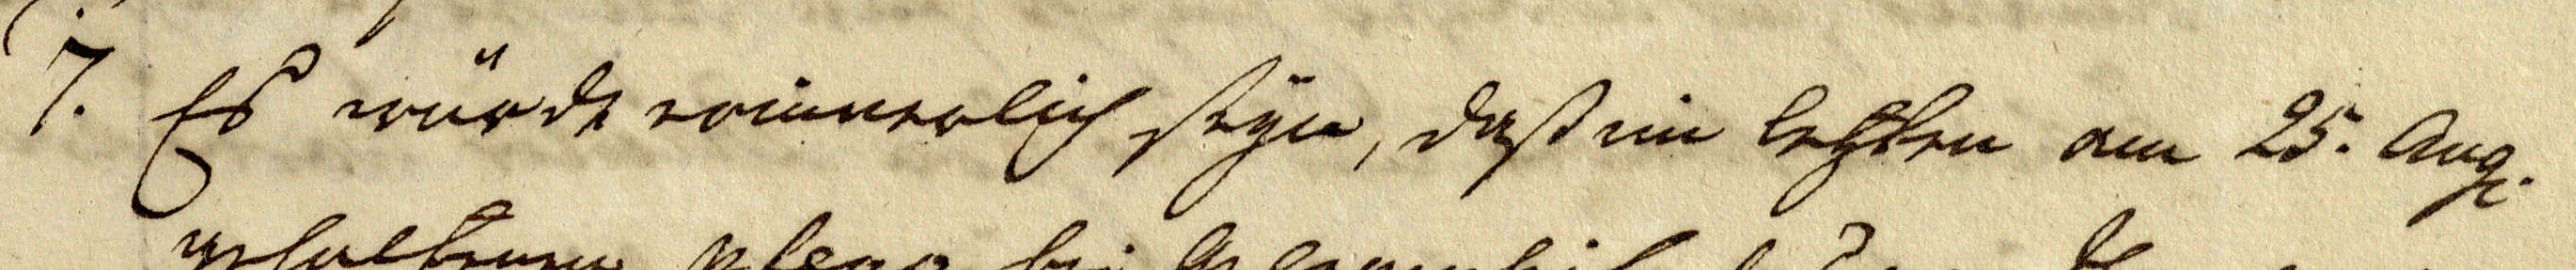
7. Es würde erinnerlich seÿn, daß im letzten am 25. Aug.
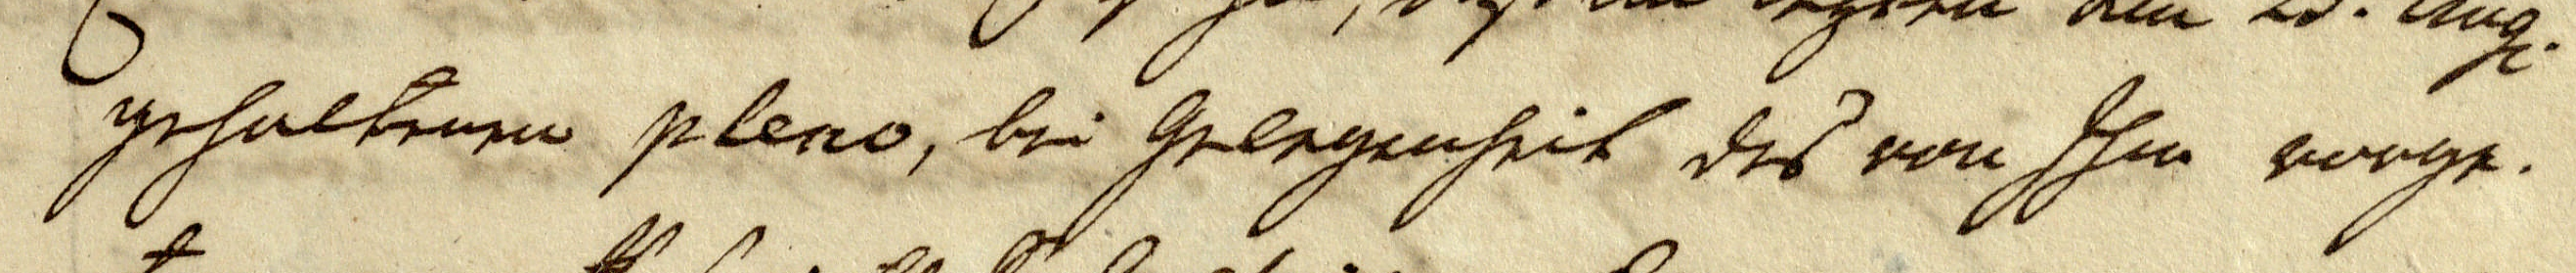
gehaltenen pleno, bei Gelegenheit des von Ihm vorge¬
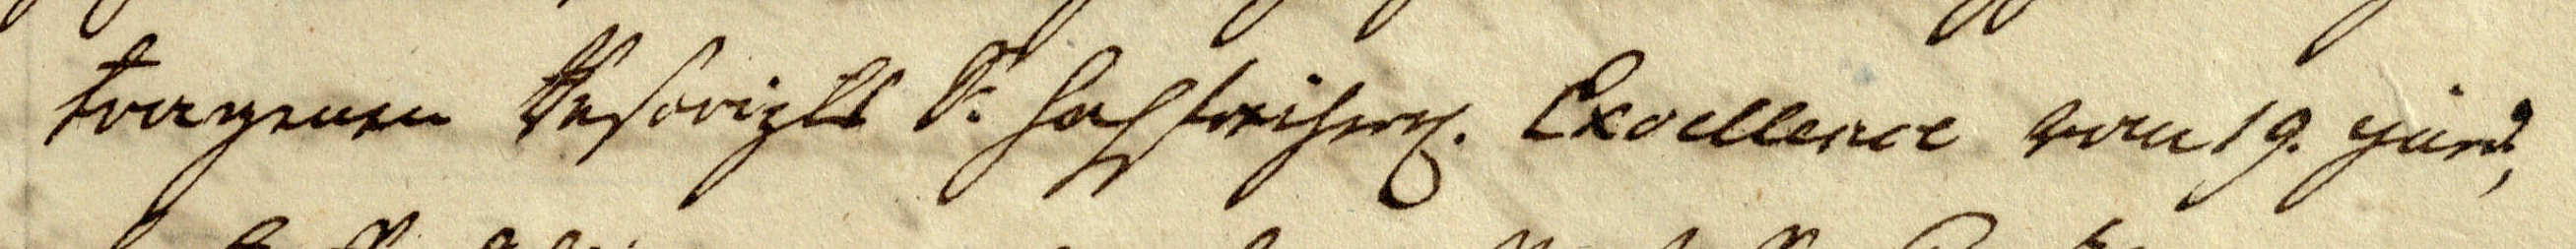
tragenen Rescripts Sr. hochfreiherrl. Excellence vom 19. ejusd,
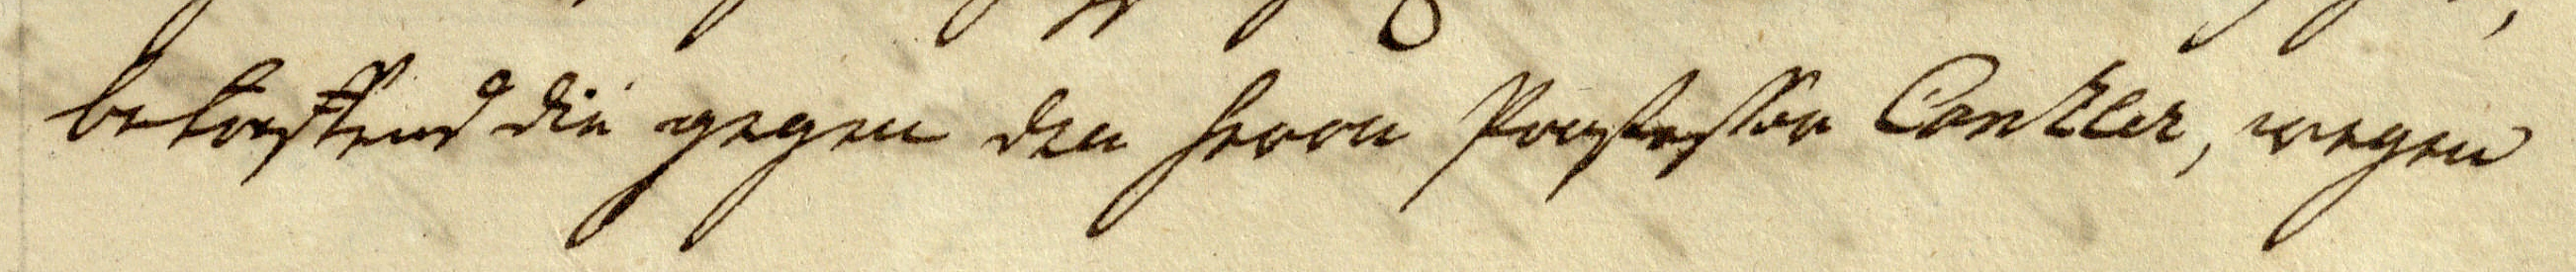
betreffend die gegen den Herrn Professor Canzler, wegen
